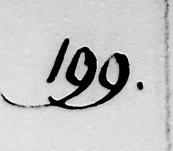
1.
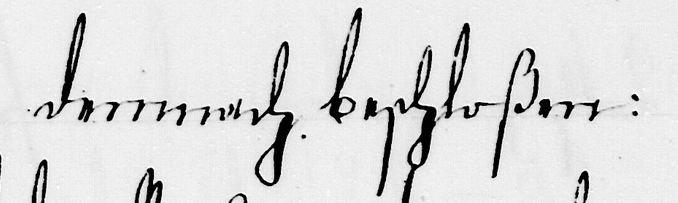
demnach beschloßen:
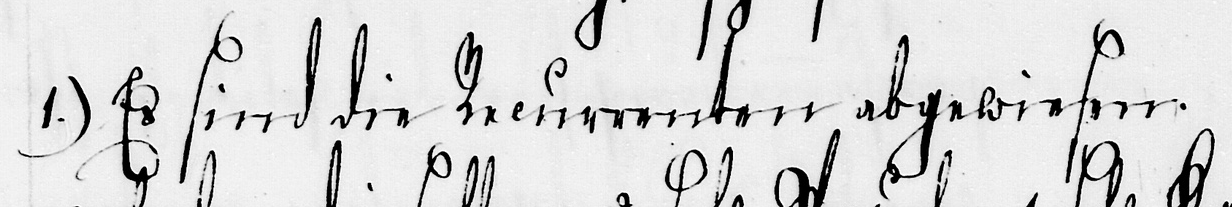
1.) Es sind die Recurrenten abgewiesen.
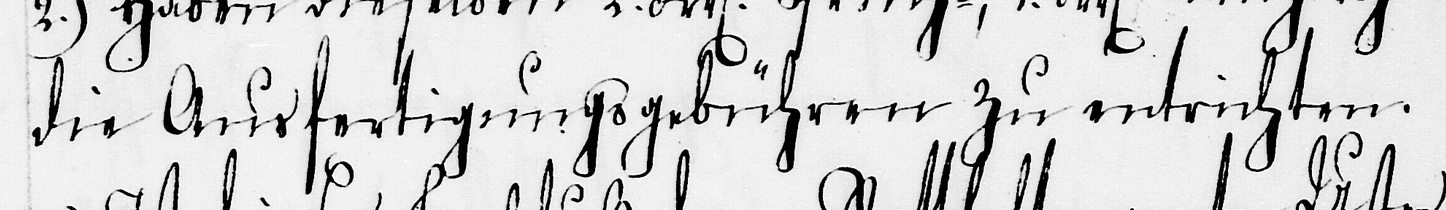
die Ausfertigungsgebühren zu entrichten.
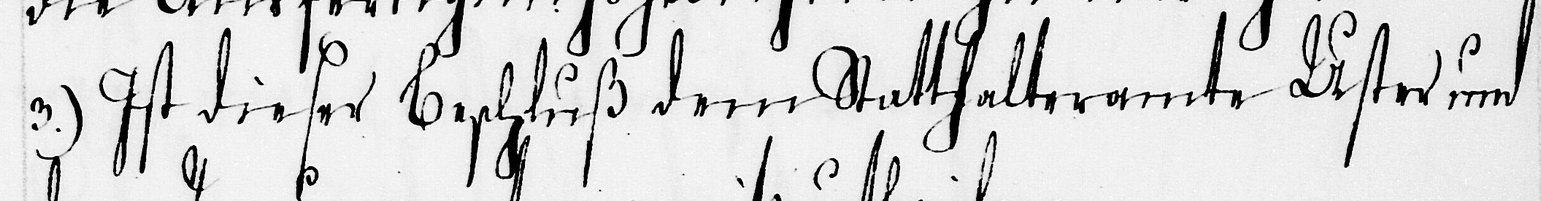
3.) Ist dieser Beschluß dem Statthalteramte Uster und
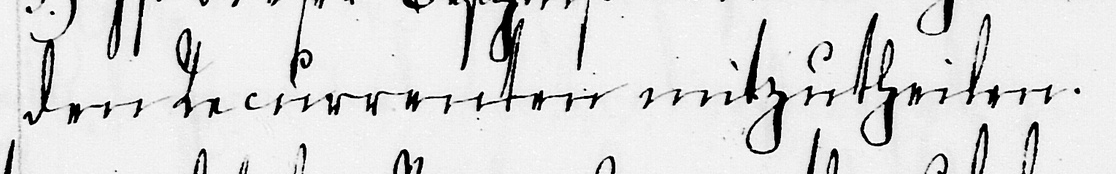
den Recurrenten mitzutheilen.
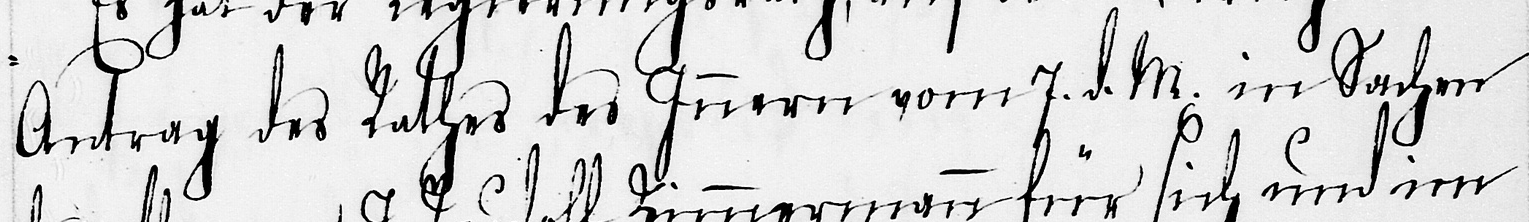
Antrag des Rathes des Innern vom 7. d. M. in Sachen
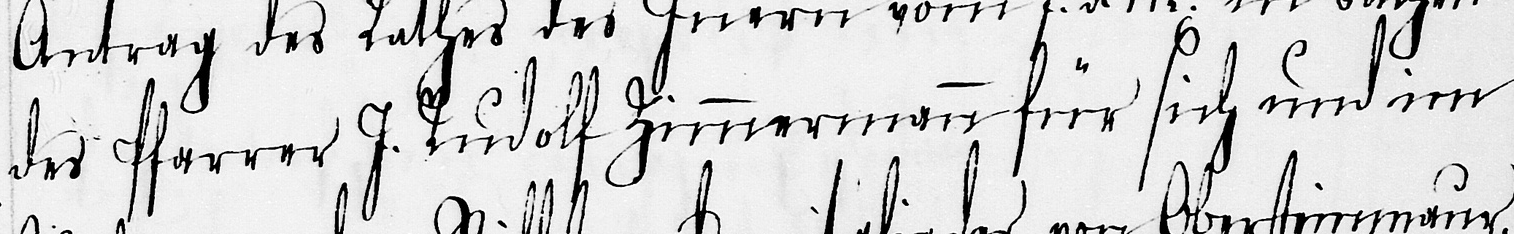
des Pfarrer J. Rudolf Zimmermann für sich und im
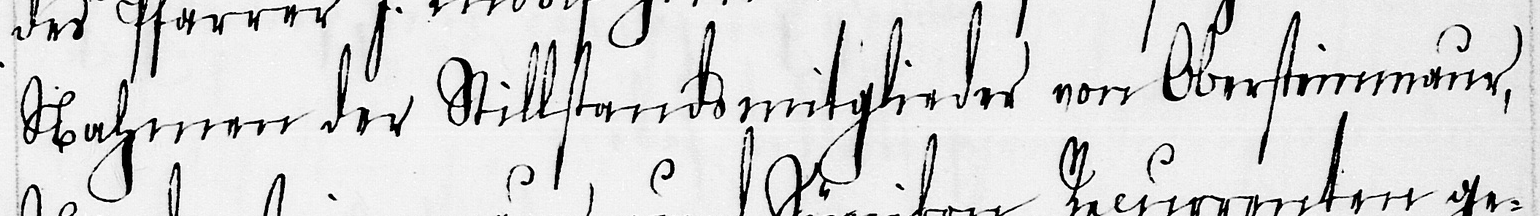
Nahmen der Stillstandsmitglieder von Obersteinmaur,
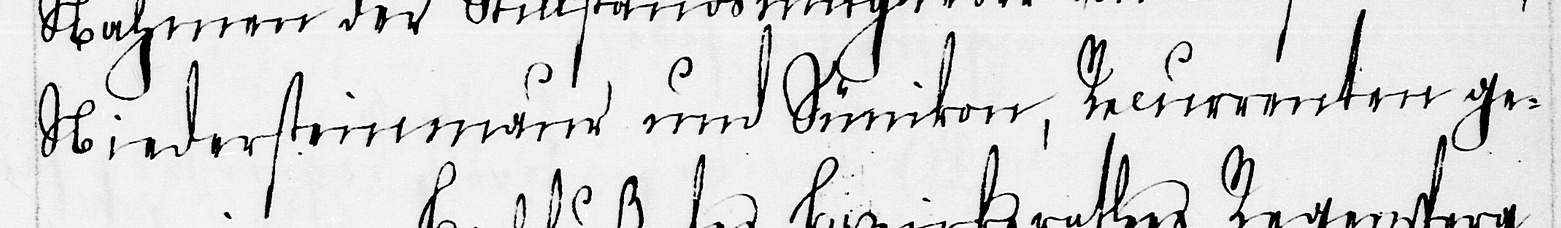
Niedersteinmaur und Sünikon, Recurrenten ge¬
